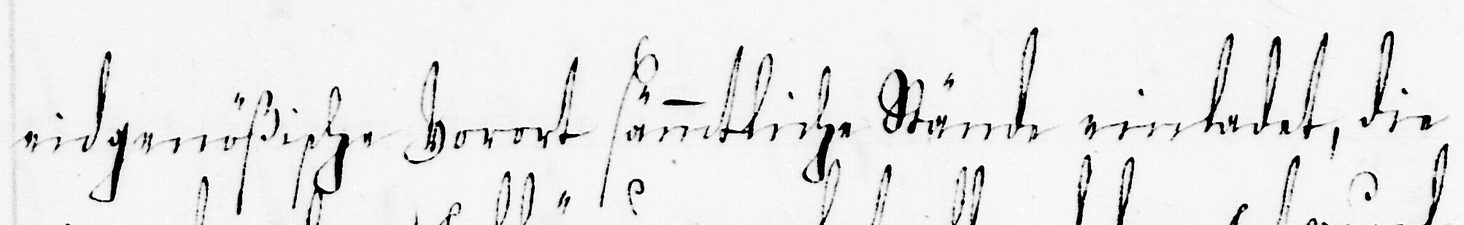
eidgenößische Vorort sämmtliche Stände einladet, die
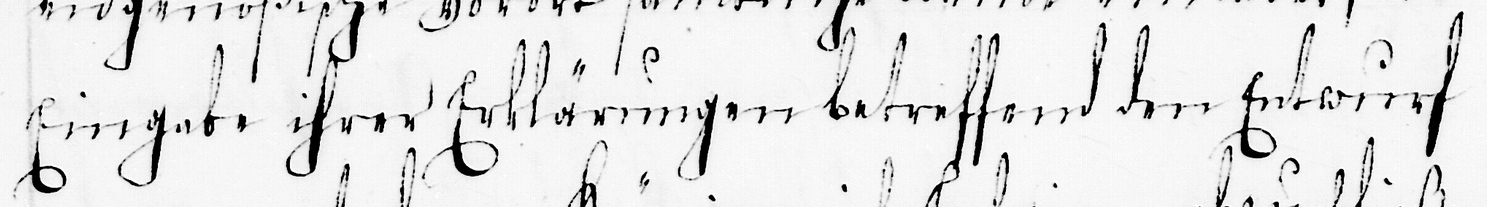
Eingabe ihrer Erklärungen betreffend den Entwurf
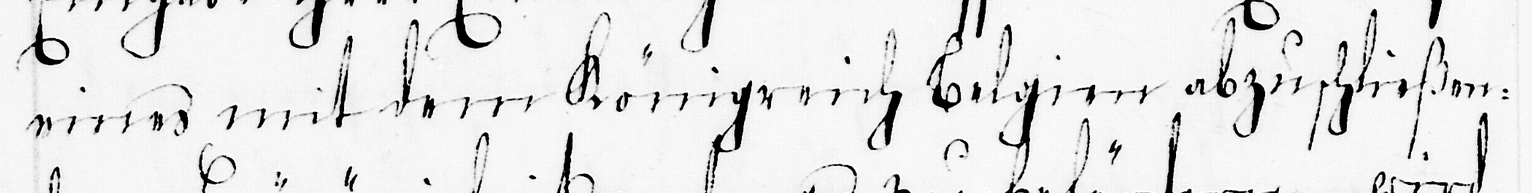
eines mit dem Königreich Belgien abzuschließen¬
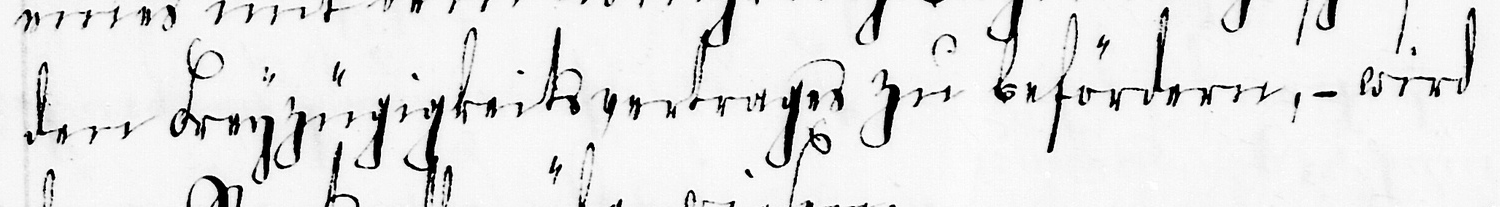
den Freyzügigkeitsvertrages zu befördern, – wird
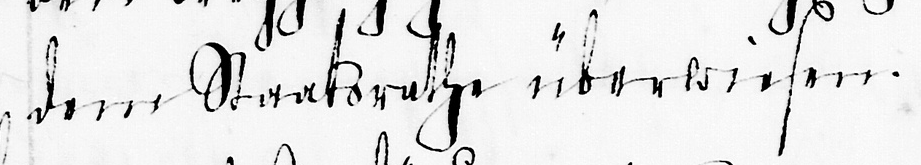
dem Staatsrathe überwiesen.
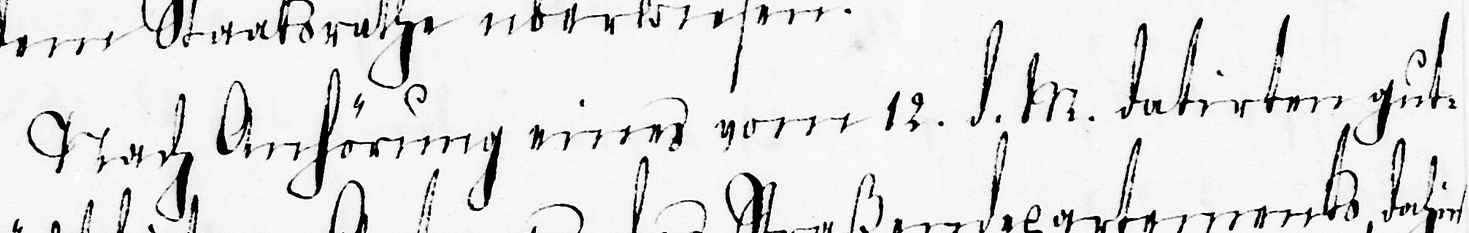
Nach Anhörung eines vom 12. d. M. datirten gut¬
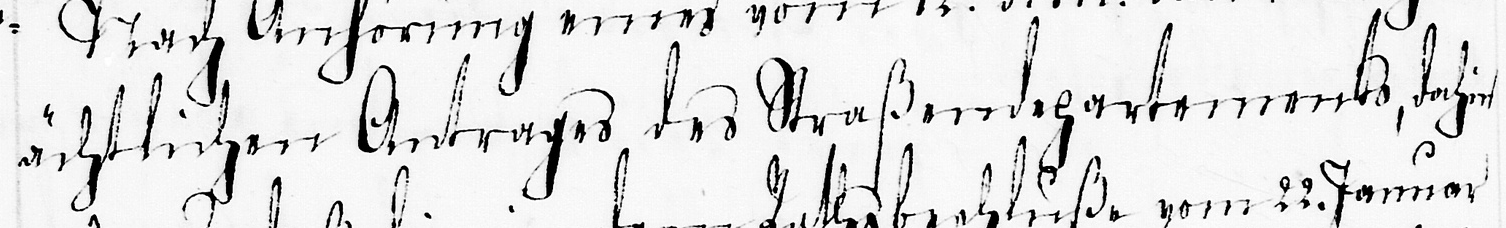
ächtlichen Antrages des Straßendepartements, dahin
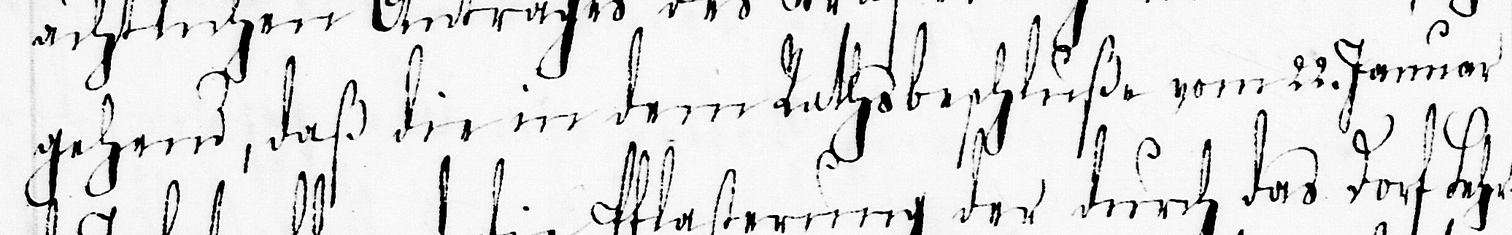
gehend, daß die in dem Rathsbeschluße vom 22. Januar
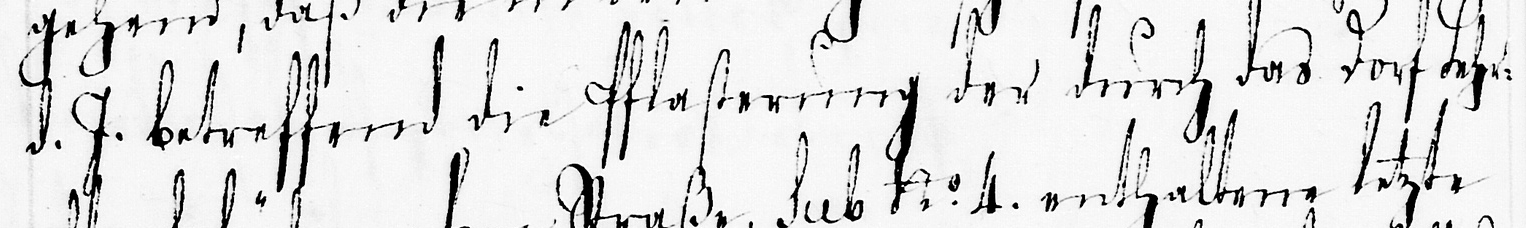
d. J. betreffend die Pflasterung der durch das Dorf Fehr¬
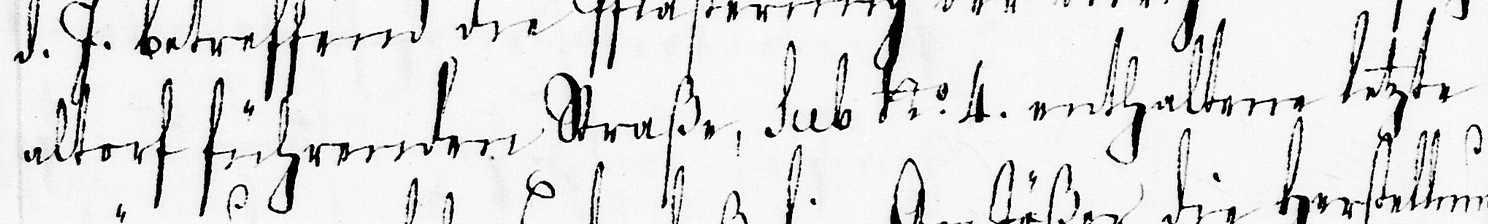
altorf führenden Straße, sub No. 4. enthaltene letzte
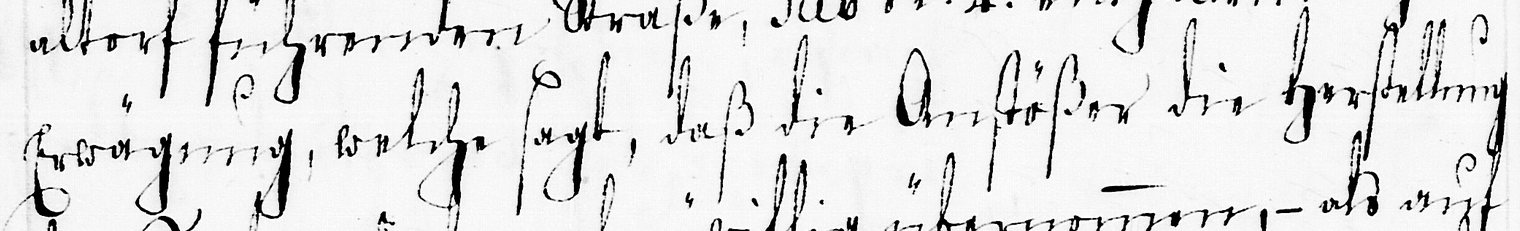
Erwägung, welche sagt, daß die Anstößer die Herstellung
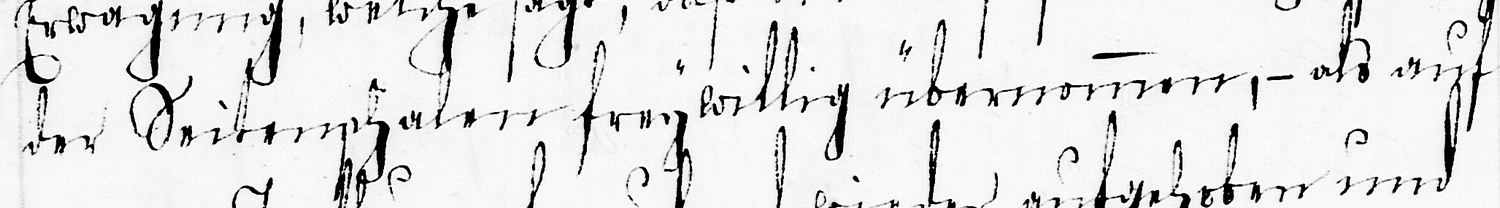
der Seitenschalen freywillig übernommen, – als auf
